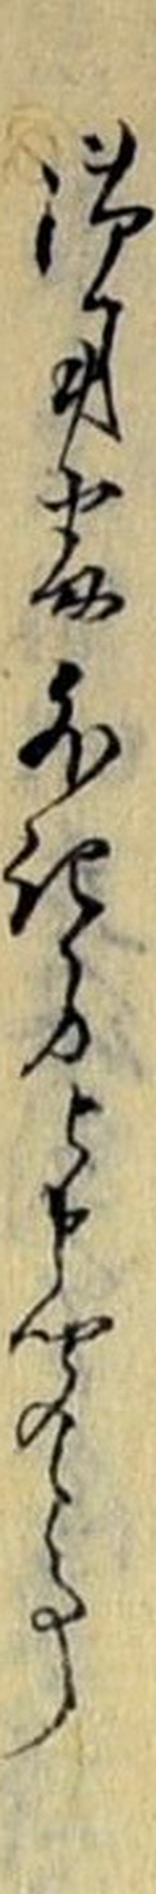御用番外記方被申聞候事
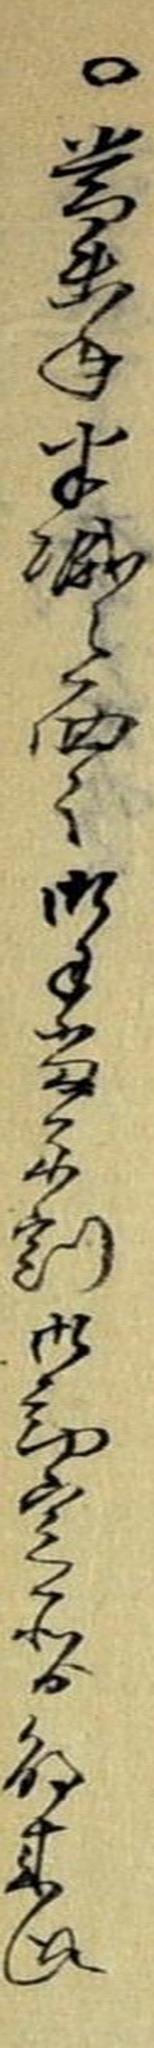○当未年半減之面々御手当米割御勘定所ゟ触来趣
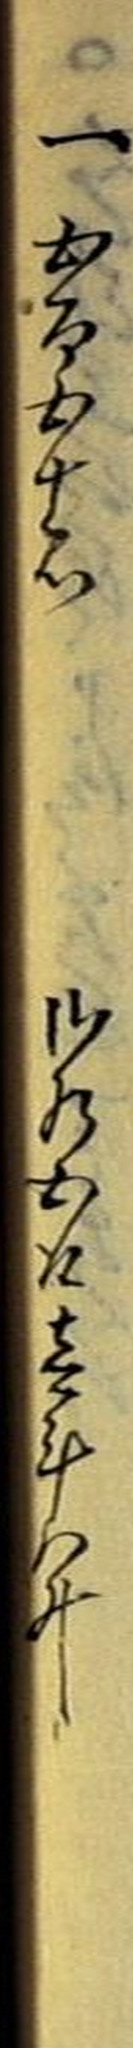一五百五十石弐拾五取壱斗八升
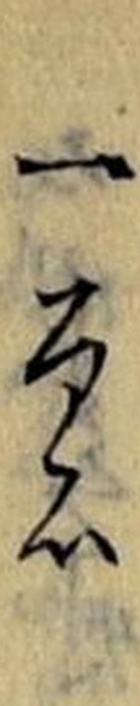一百石
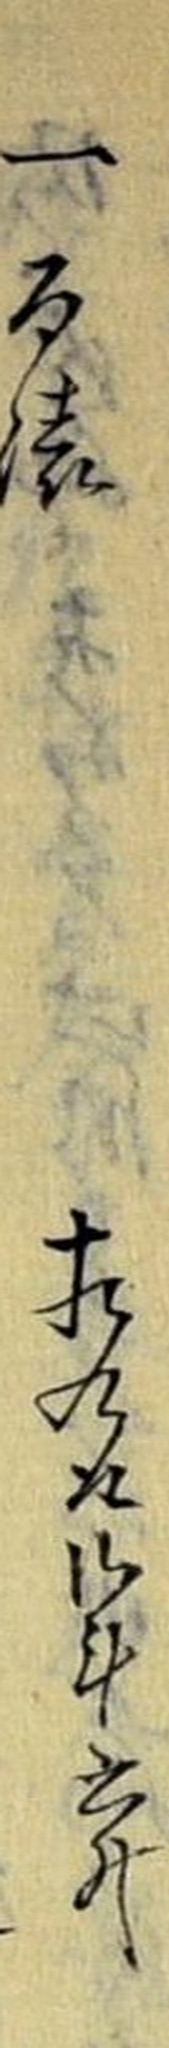一百俵拾九取弐と六升
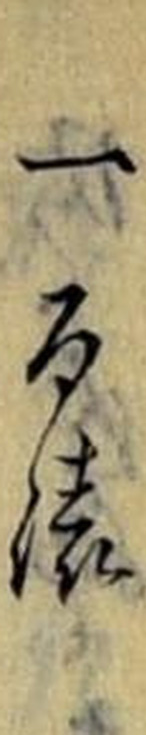一百石
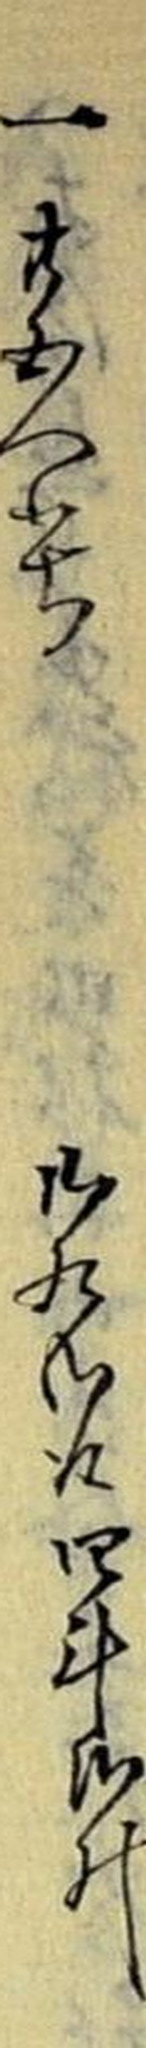一弐五人ふち弐拾弐取四斗弐升
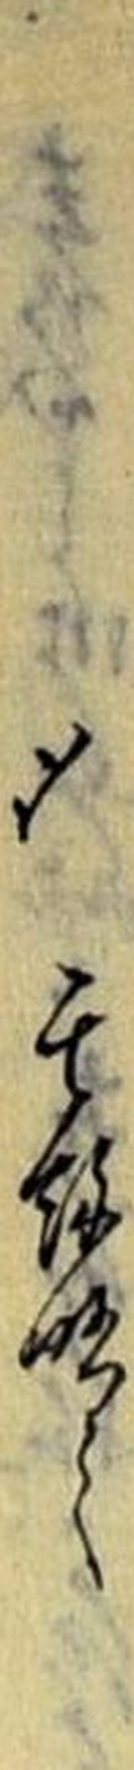〆其餘略之
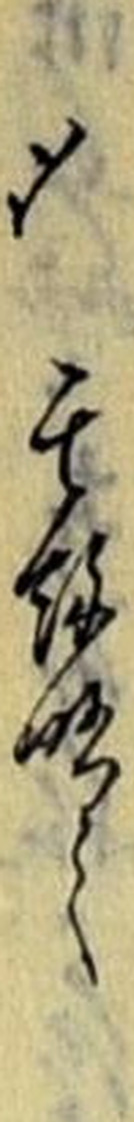〆其餘略之
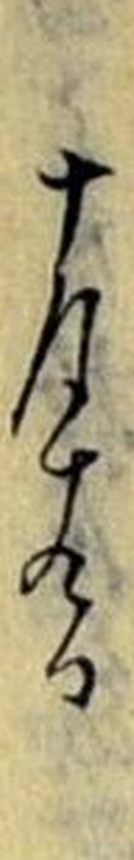十月十九日
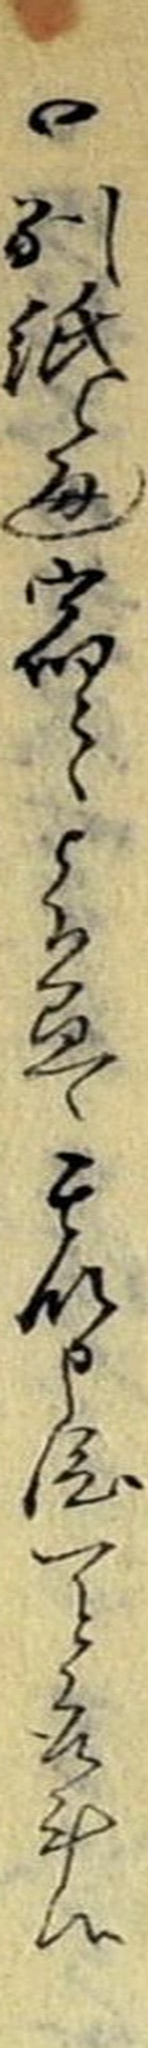○別紙之通宿々へ被下置候其談申渡可被取斗候
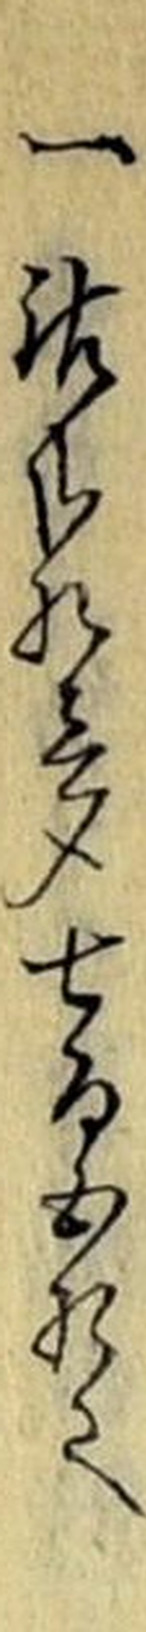一銀弐拾壱貫七百五拾匁
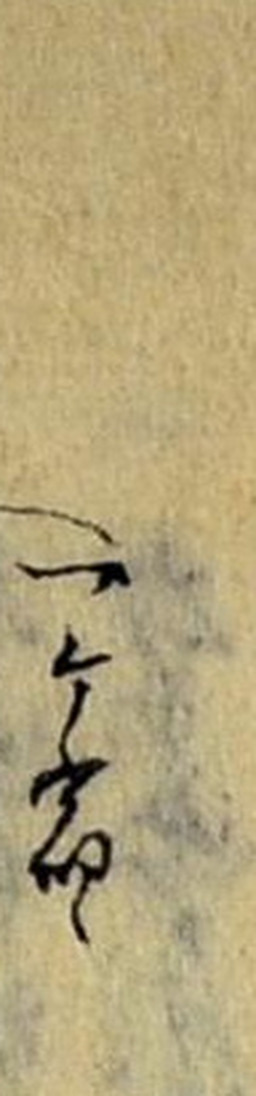一ヶ宿へ
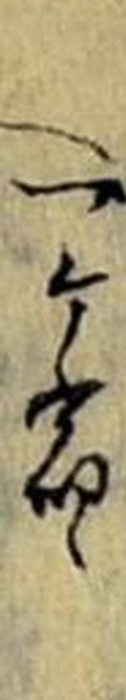一ヶ宿へ

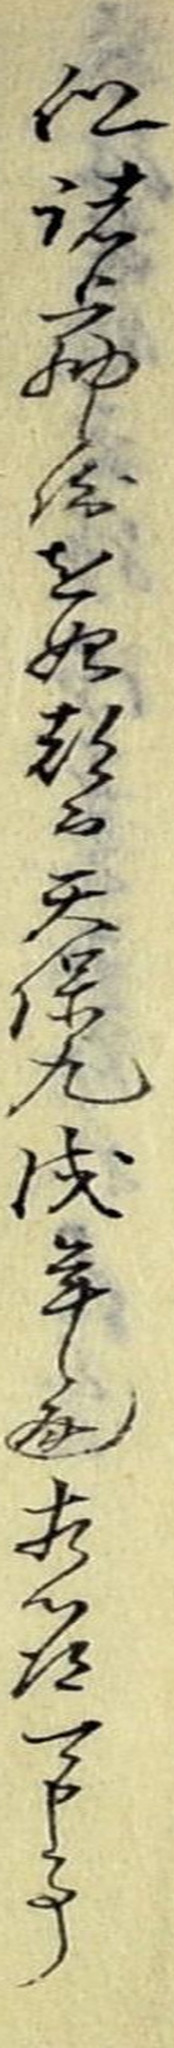但諸上納之儀を始都而天保九戌年之通相心得可申事
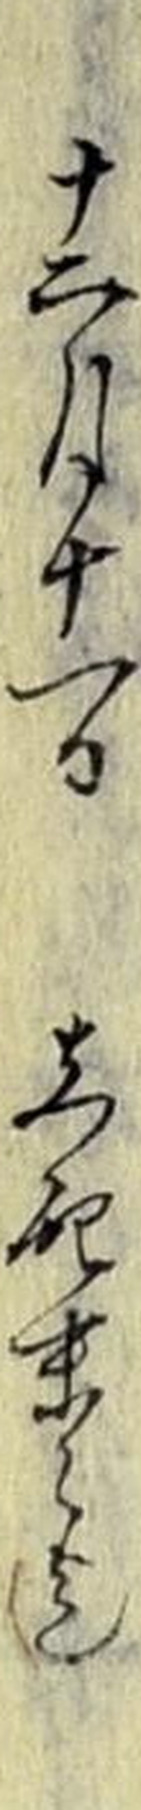十二月十一日支配末々迄
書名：命令之部 六
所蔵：福井県文書館 Fukui Prefectural Archives
